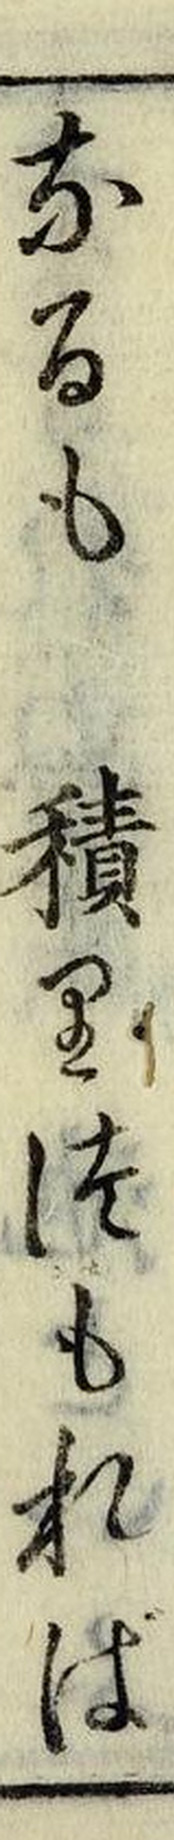なるも積りつもれば
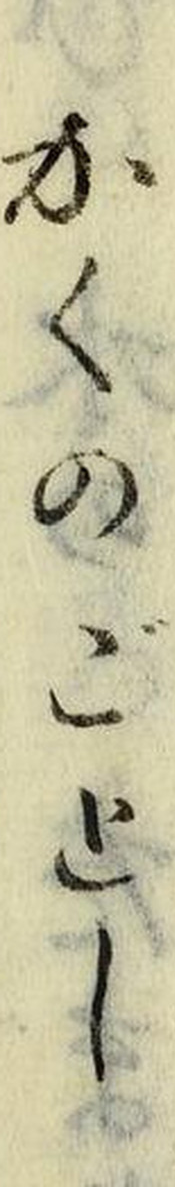かくのごとし
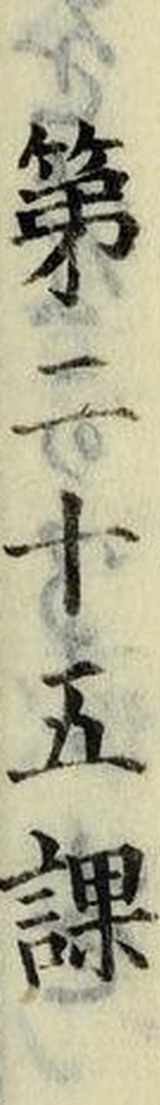第二十五課
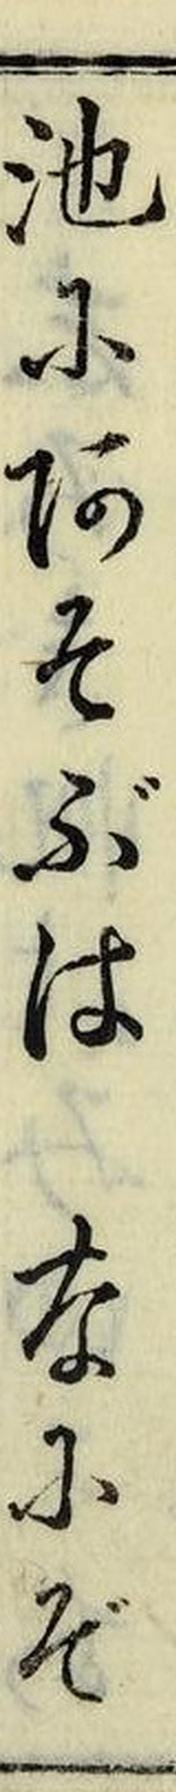池にあそぶはなにぞ
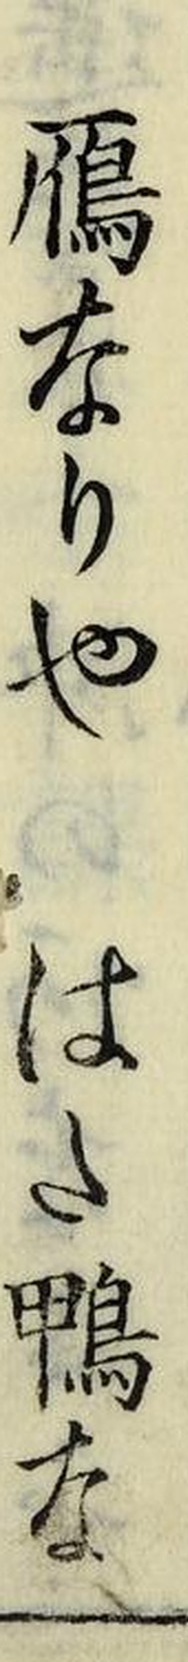雁なりやはた鴨な
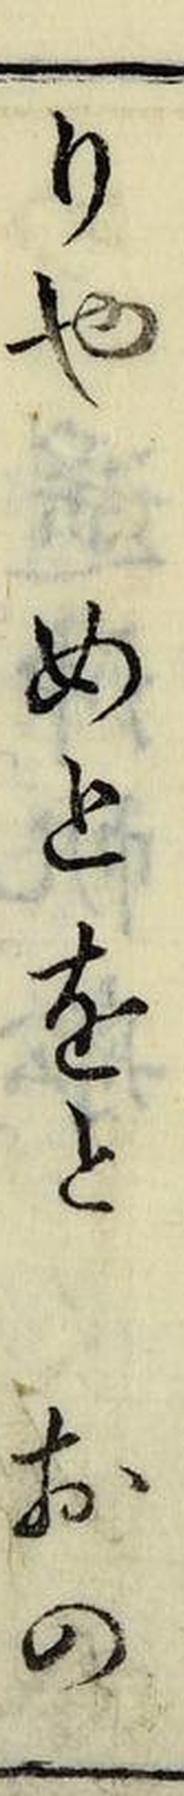りやめとをとおの
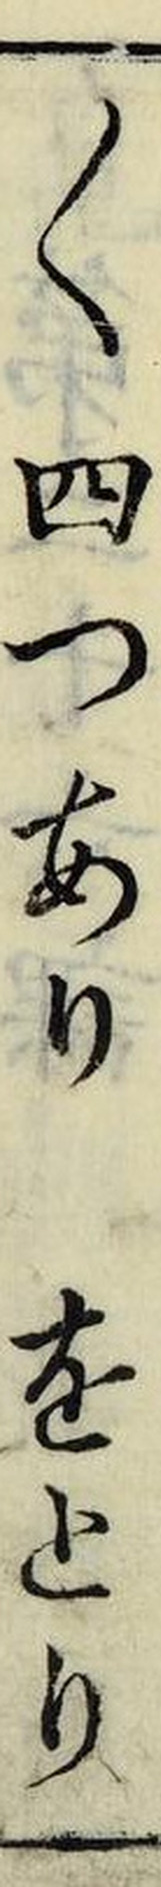〳〵四つありをとり
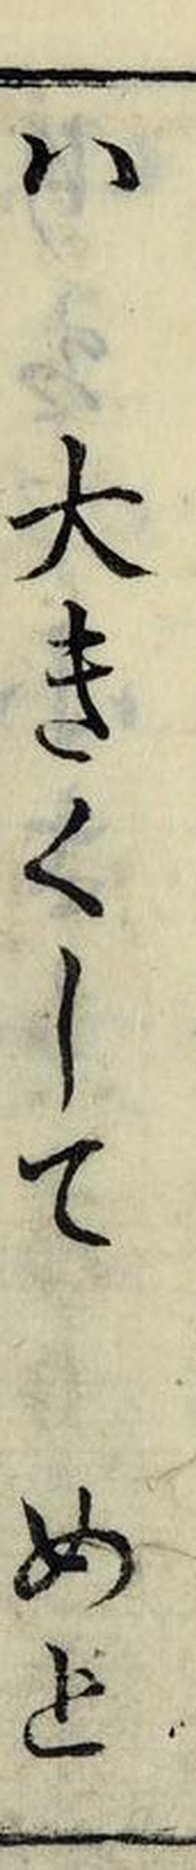は大きくしてめと

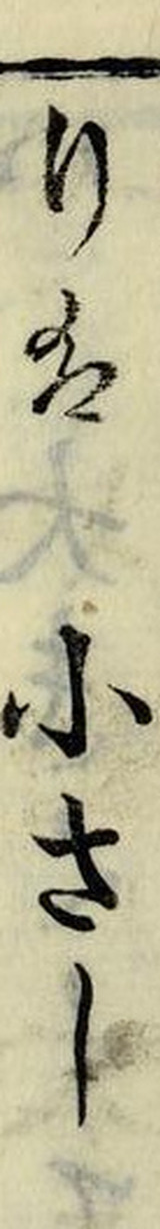りは小さし
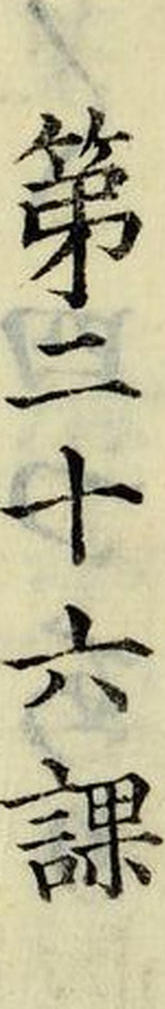第二十六課
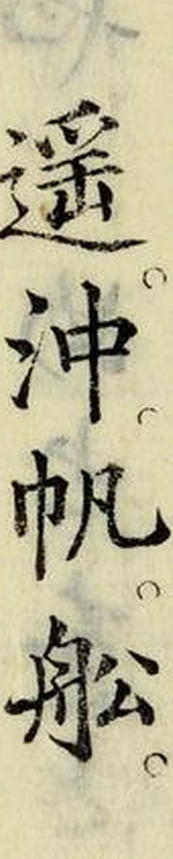遥。沖。帆。舩。
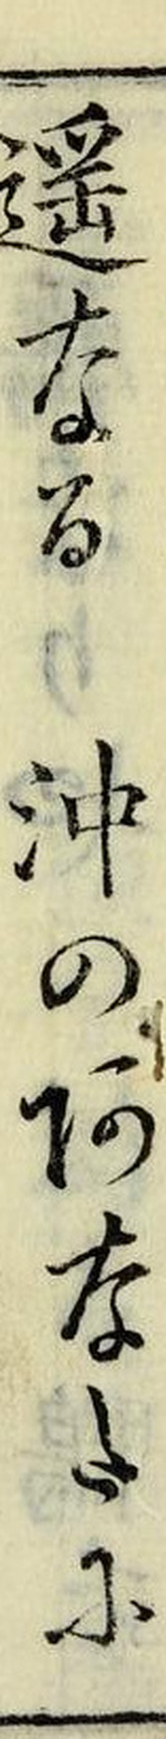遥なる沖のあなたに
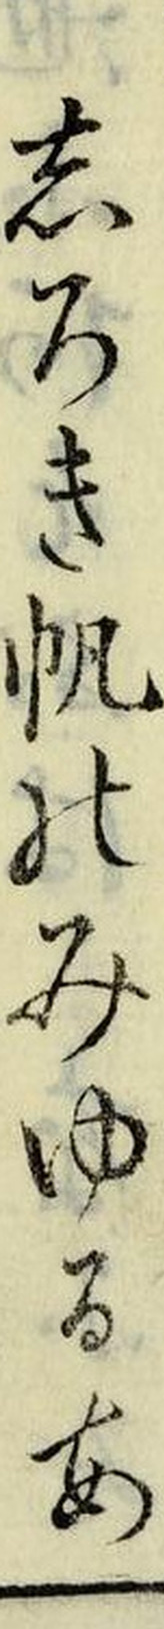しろき帆のみゆるあ
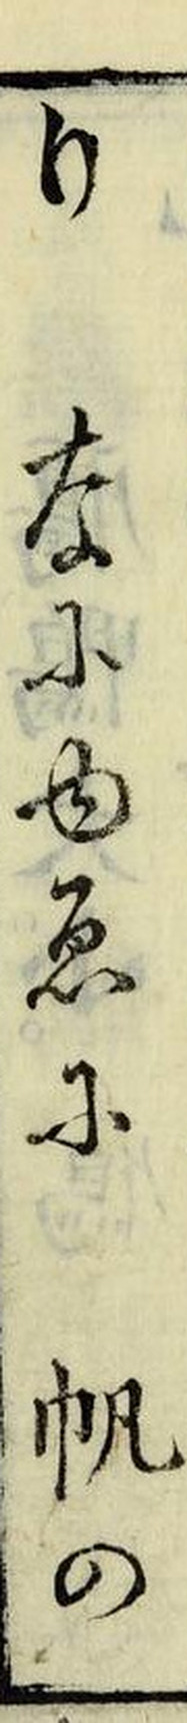りなにゆゑに帆の
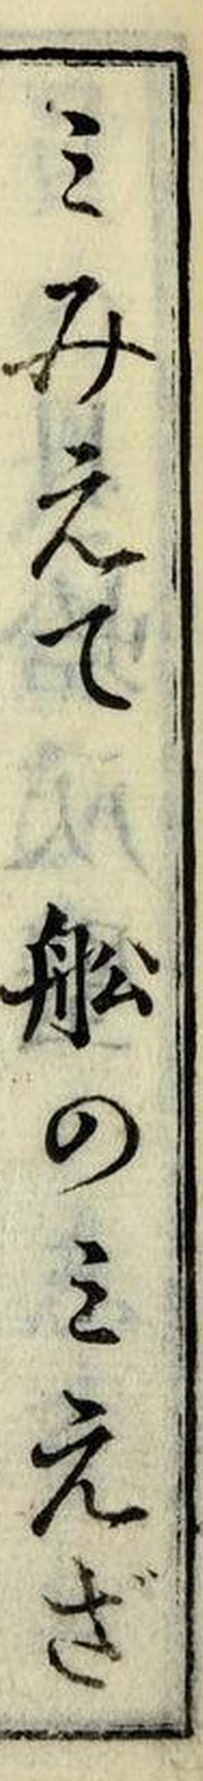みみえて船のみえざ
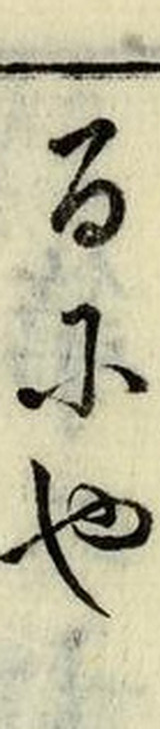るにや
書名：小学読本 初等科 巻一
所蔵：福井県文書館 Fukui Prefectural Archives
